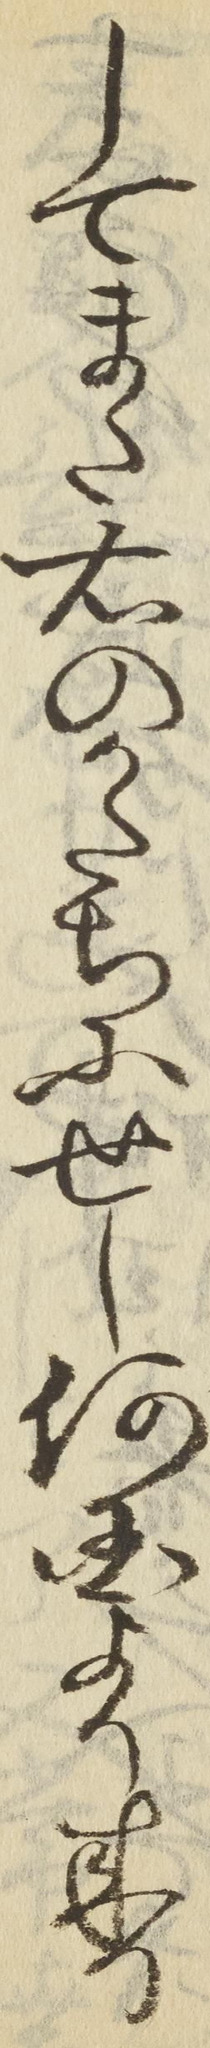してまた右のかたちにせし何国より来り
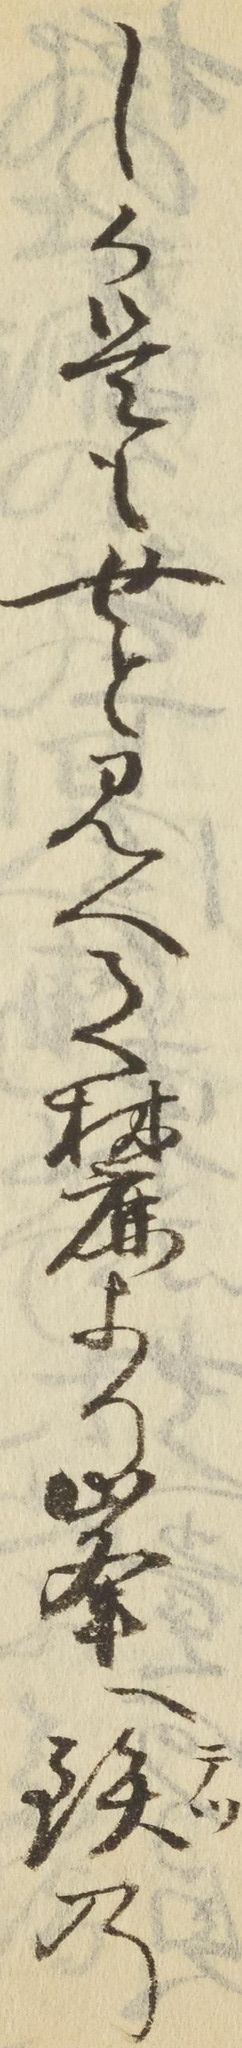しか是も女見へて麓より峯へ鉄の
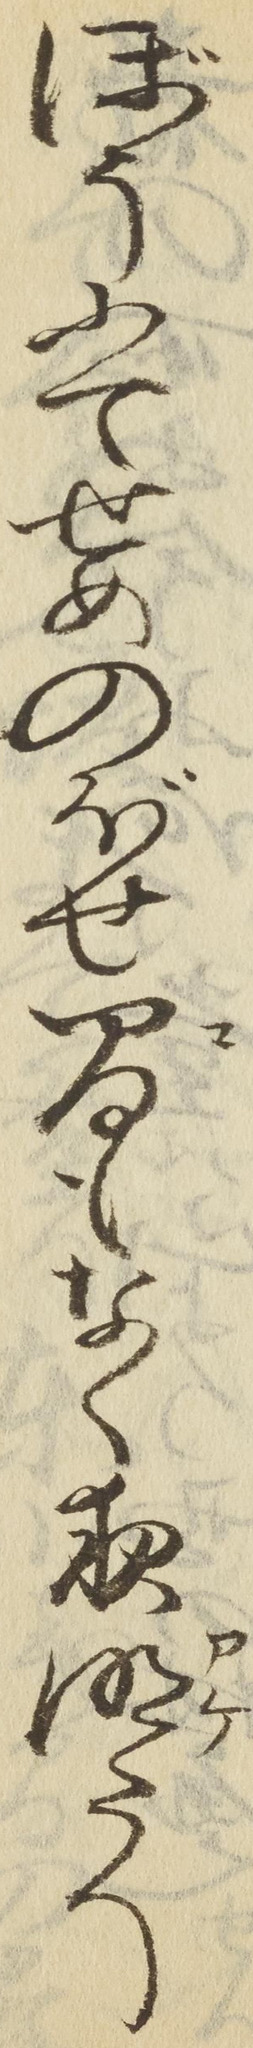ぼうにてせめのごり間もなく夜明たり
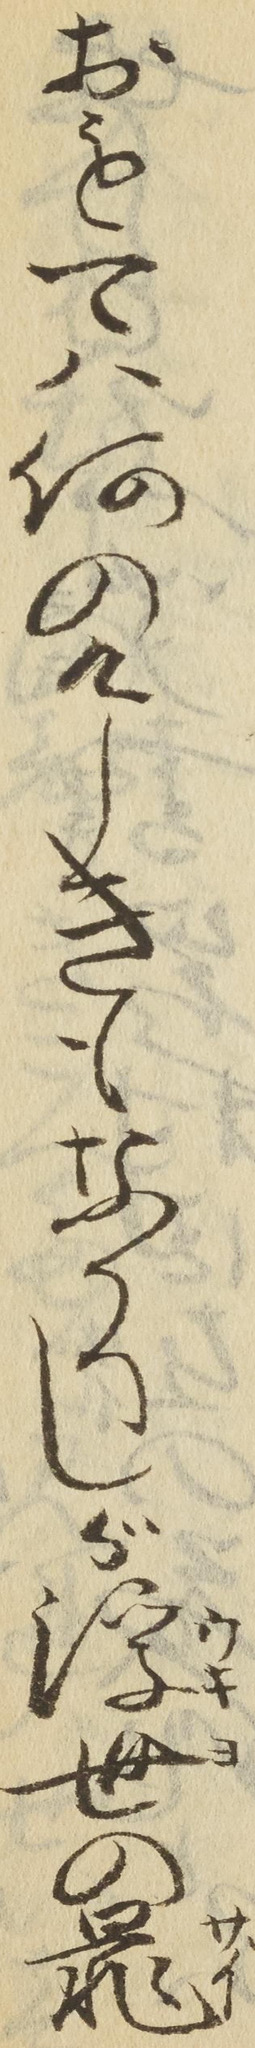おもては何のけしきもなかりしが浮世の罪
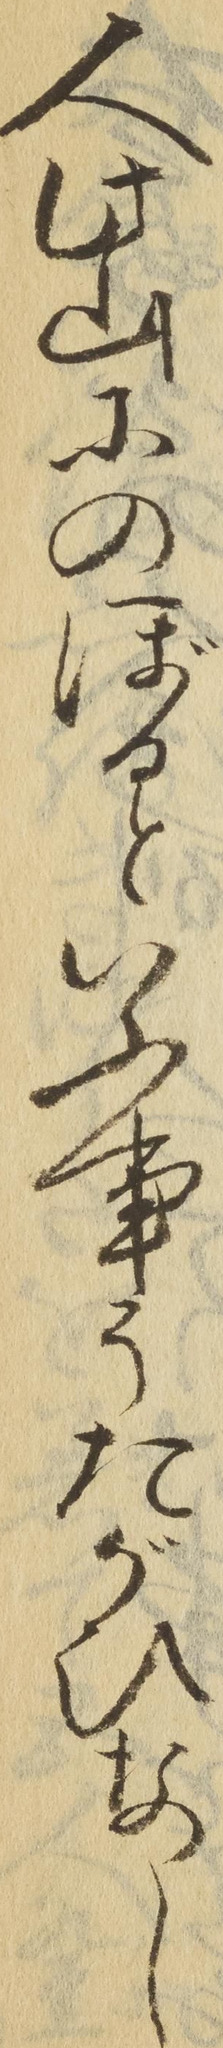人此山にのぼるといふ事うたかひなし

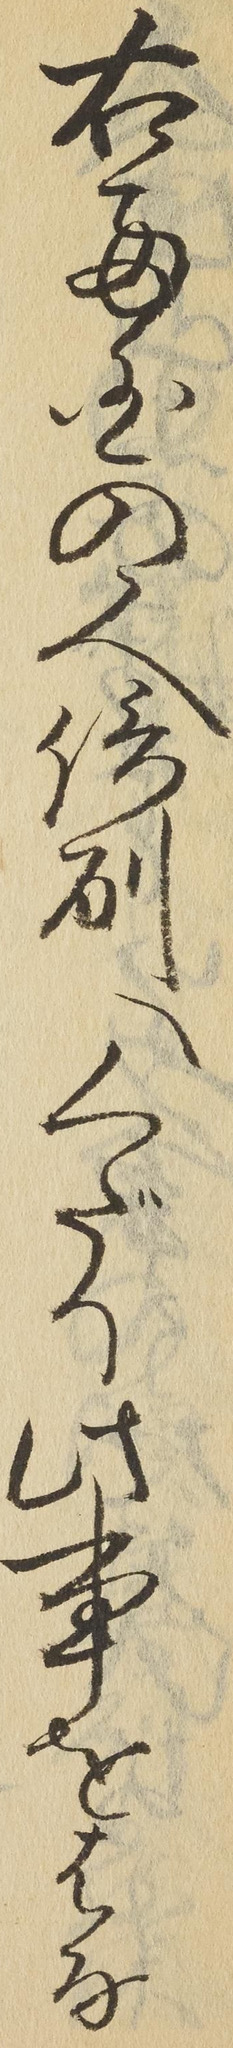右両国の人信州へくだり此事をまな
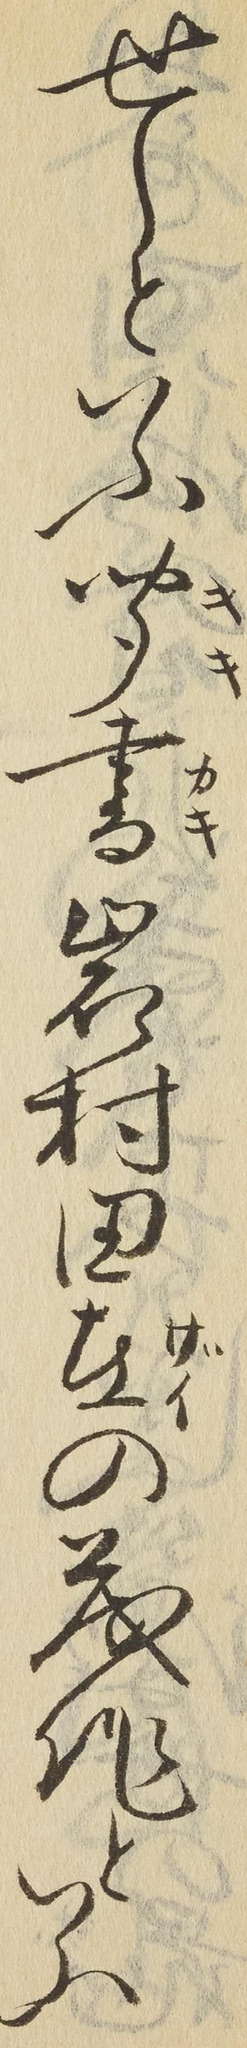せしといふ聞書岩村田在の茂作といふ
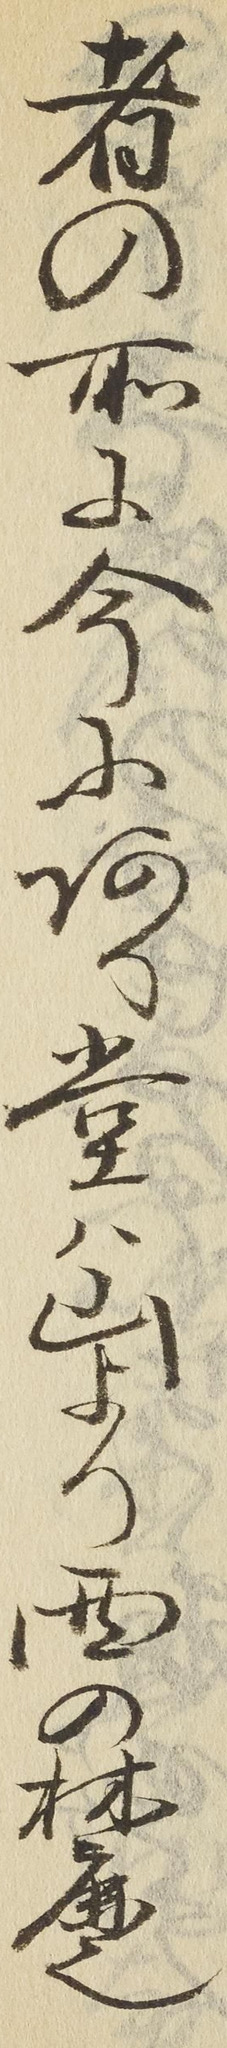者の所に今にあり堂は山より西の麓也
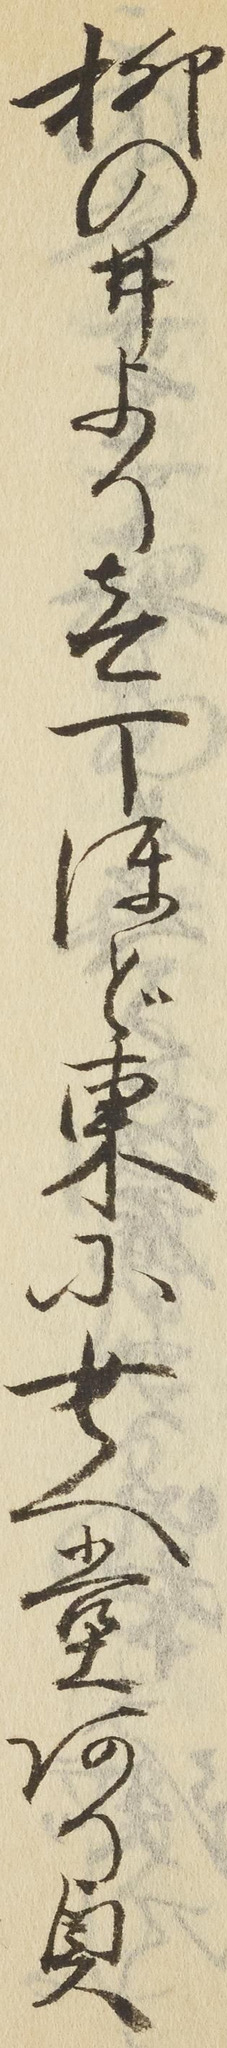柳の井より壱丁ほど東に女人堂あり貞
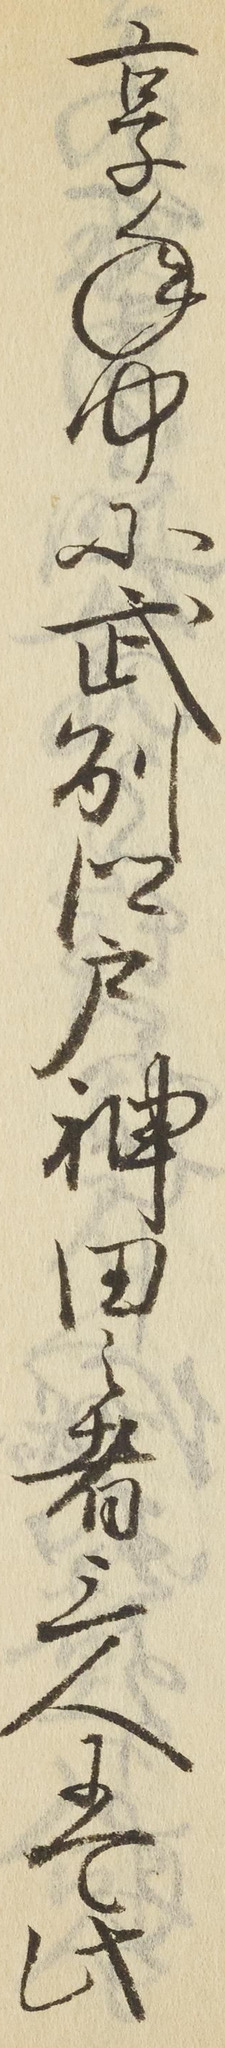享年中に武州江戸神田之者三人にて此
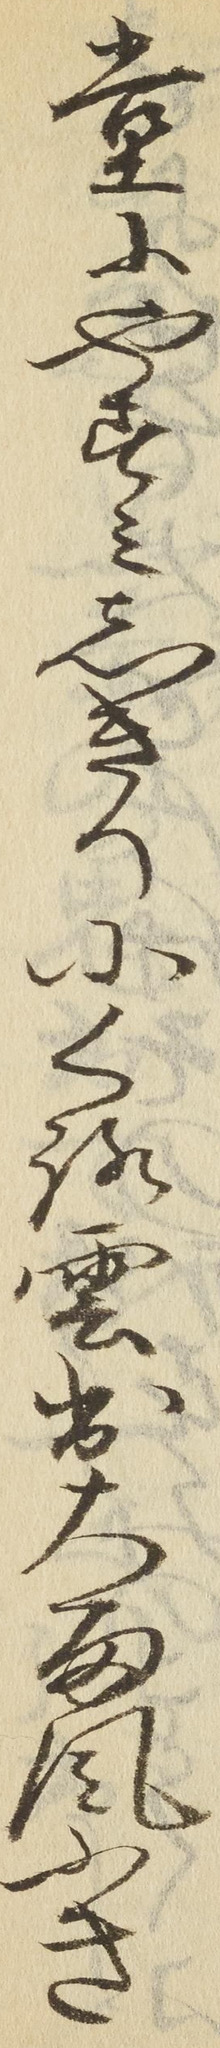堂にやすみしきりにくろ雲出大雨風ふき
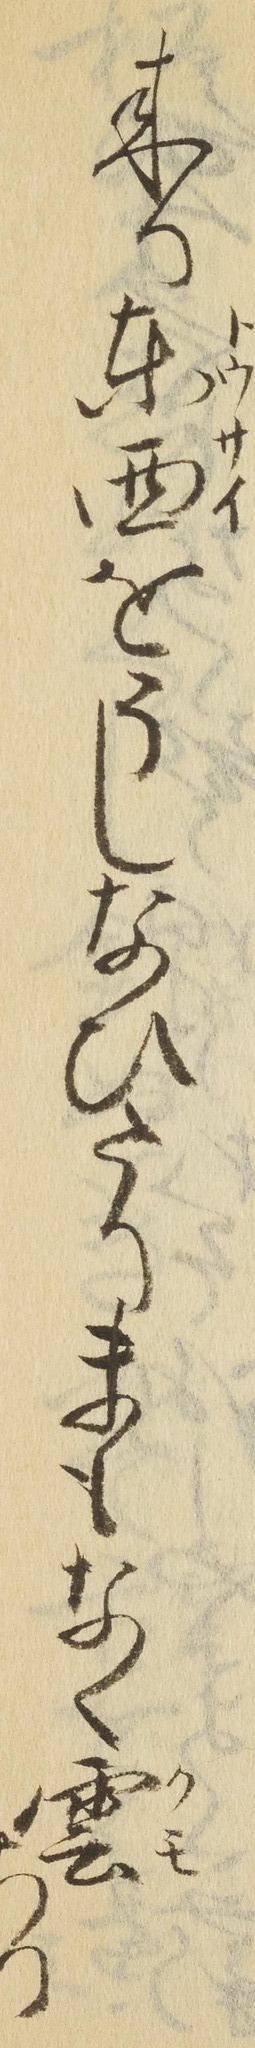来り東西をうしなひたりまもなく雲ちり
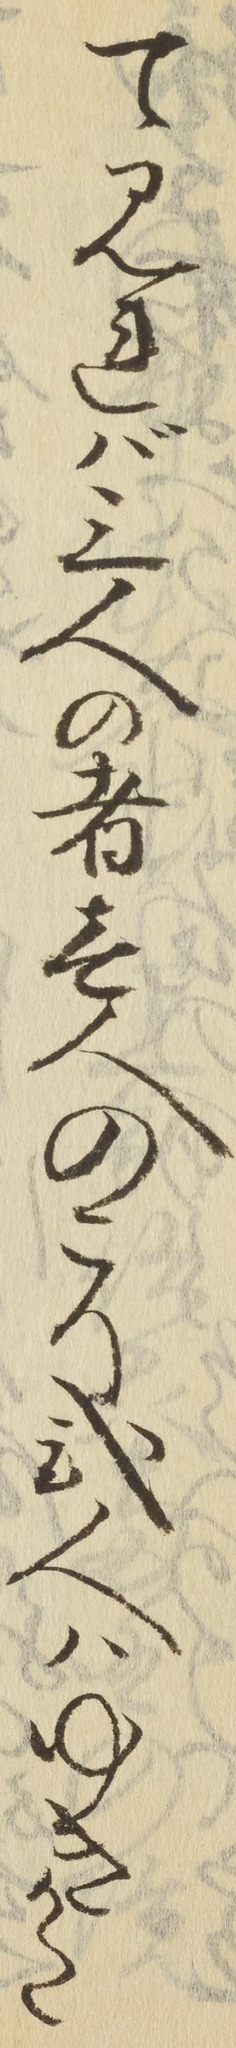て見れば三人の者壱人のこり弐人はゆきかた
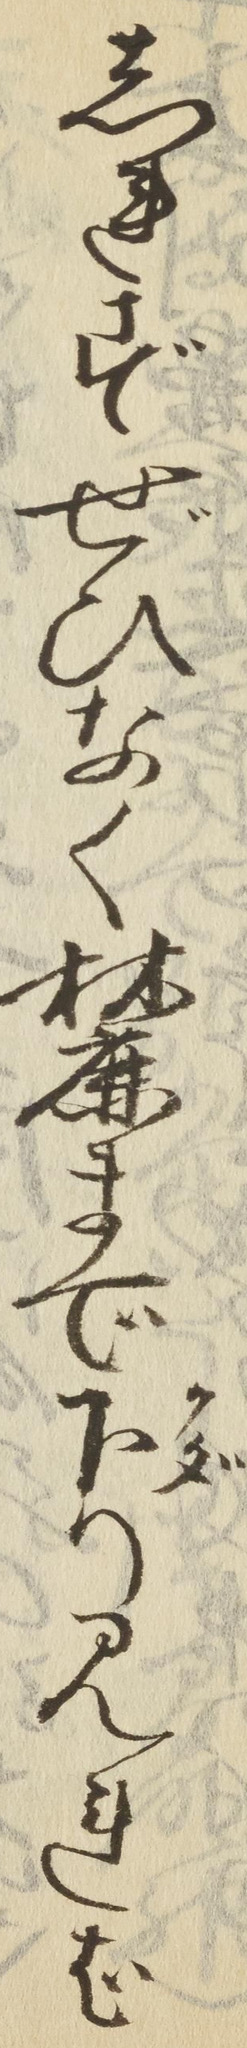しれずぜひなく麓まで下り見れば
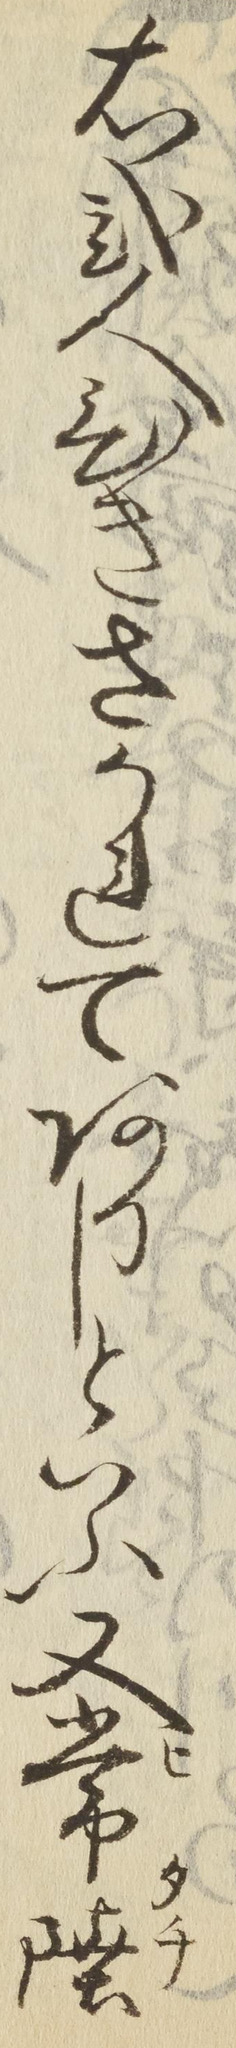右弐人ひきさかれてありしといふ又常陸
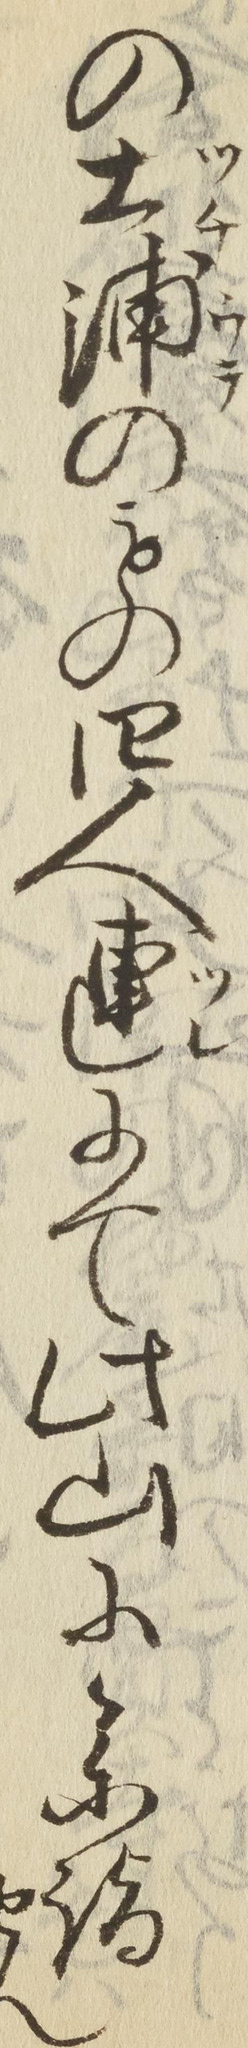の土浦のもの四人連にて此山に参詣せん
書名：浅間大變記
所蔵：東京大学地震研究所図書室 Earthquake Research Institute Library, The University of Tokyo, JAPAN
